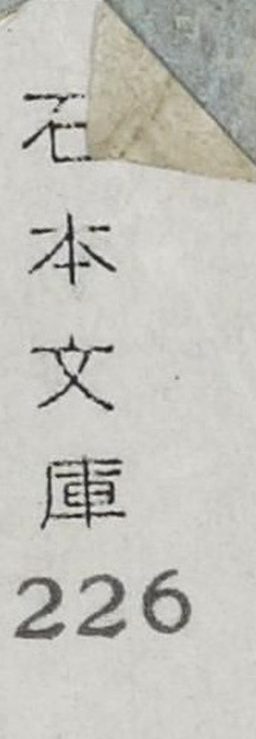石本文庫
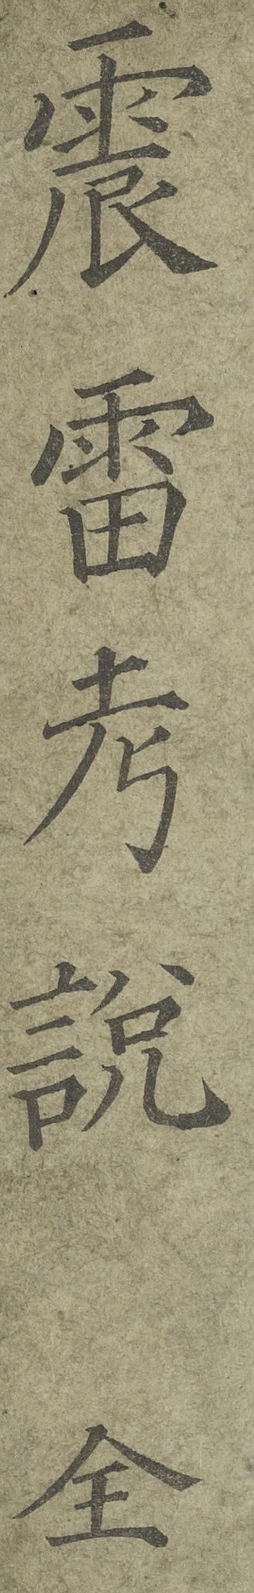震雷考説全

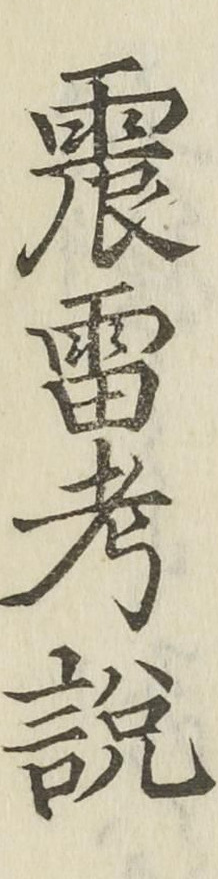震雷考説
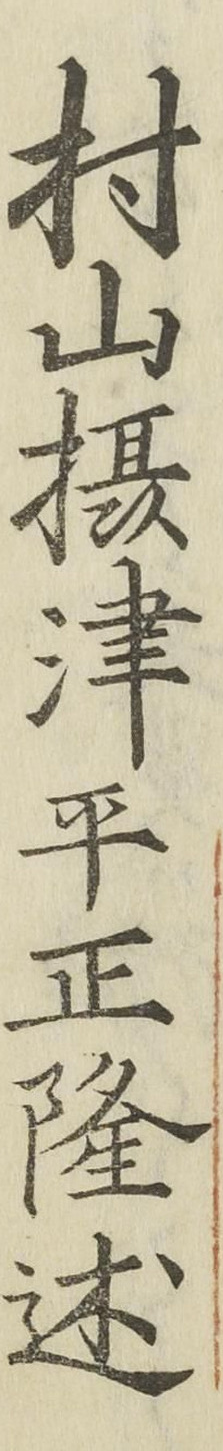村上摂津平正隆述
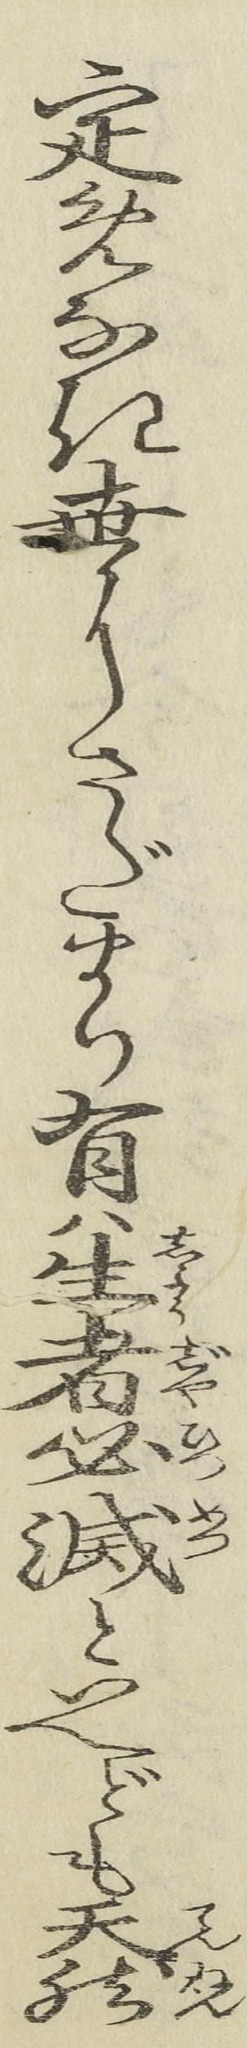〇定めなき世にさだまり有は生者必滅といへども天然
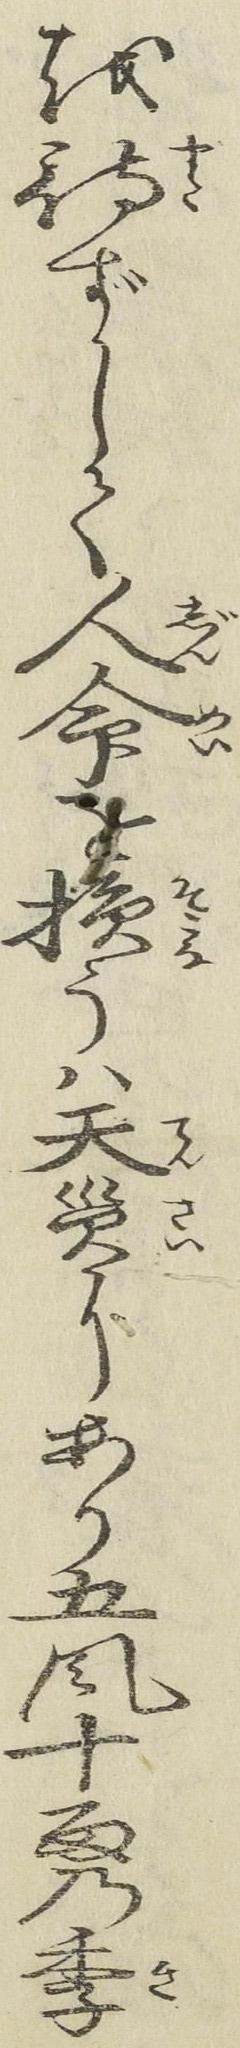を待ずして人命を損うは天災にあり五風十雨の季
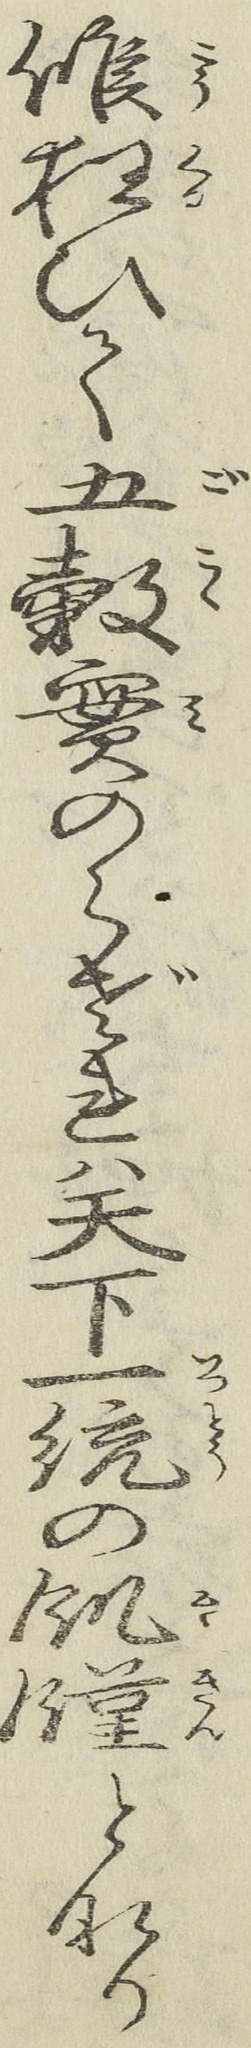候狂ひて五穀実のらざれは天下一統の飢饉となり
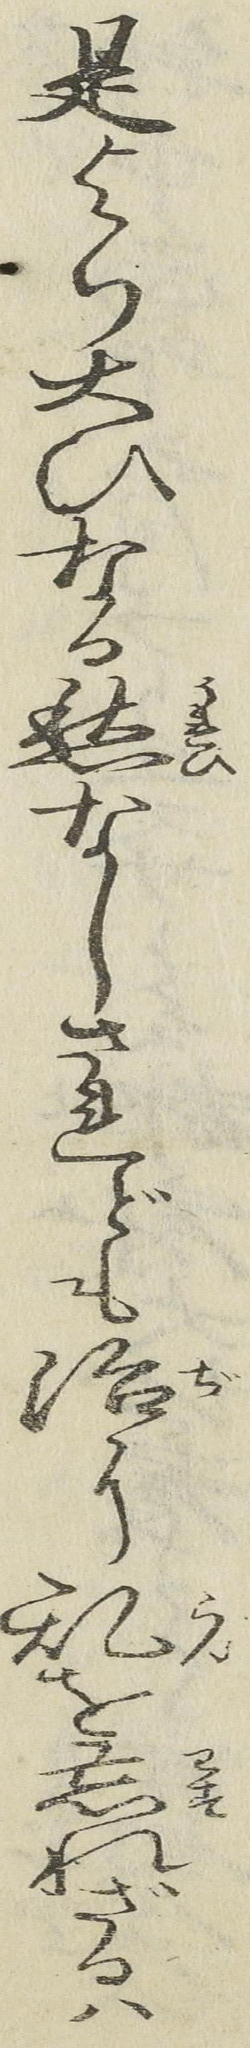是より大ひなる愁なしされども治に乱を忘れざるは
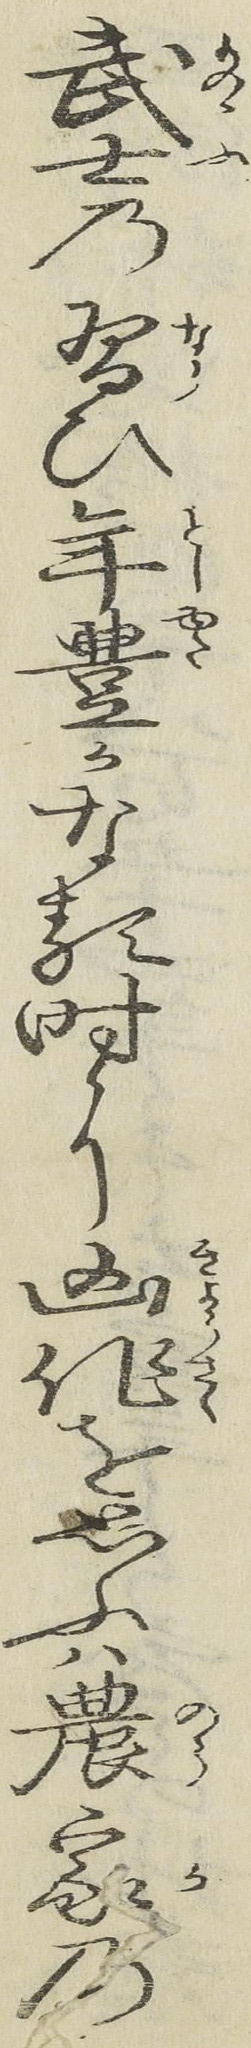武士の習ひ年豊かなる時に凶作を思ふは農家の
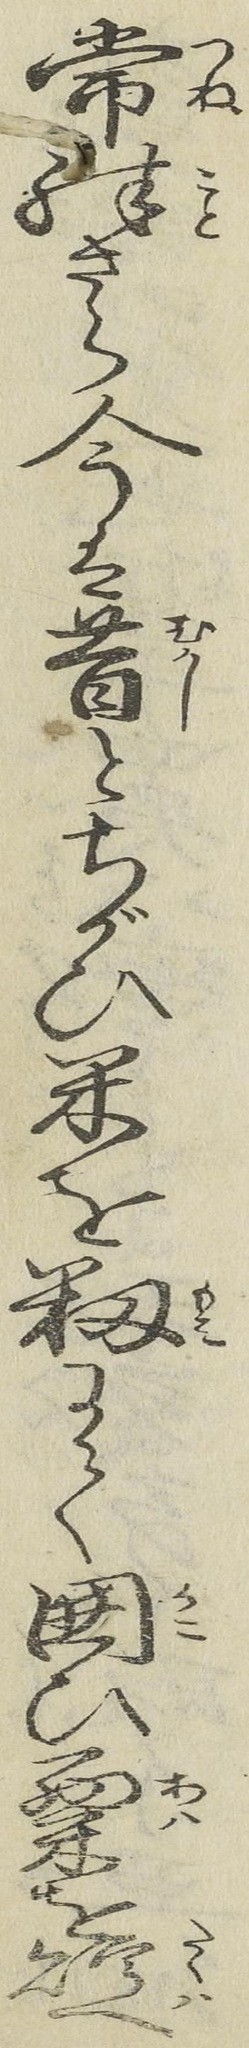常殊さら今は昔とちがひ米を籾にて囲ひ粟を貯へ
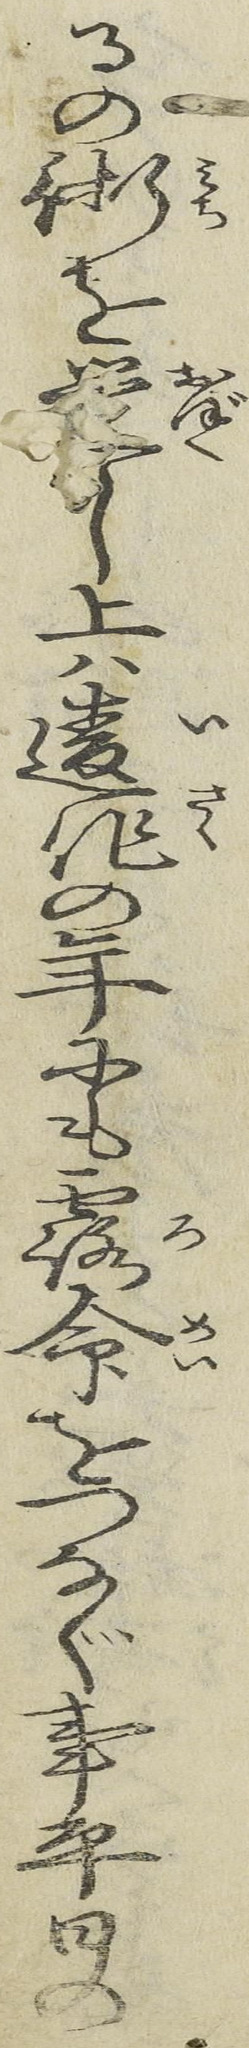るの術を覚し上は違作の年にも露命をつなぐ事平日の

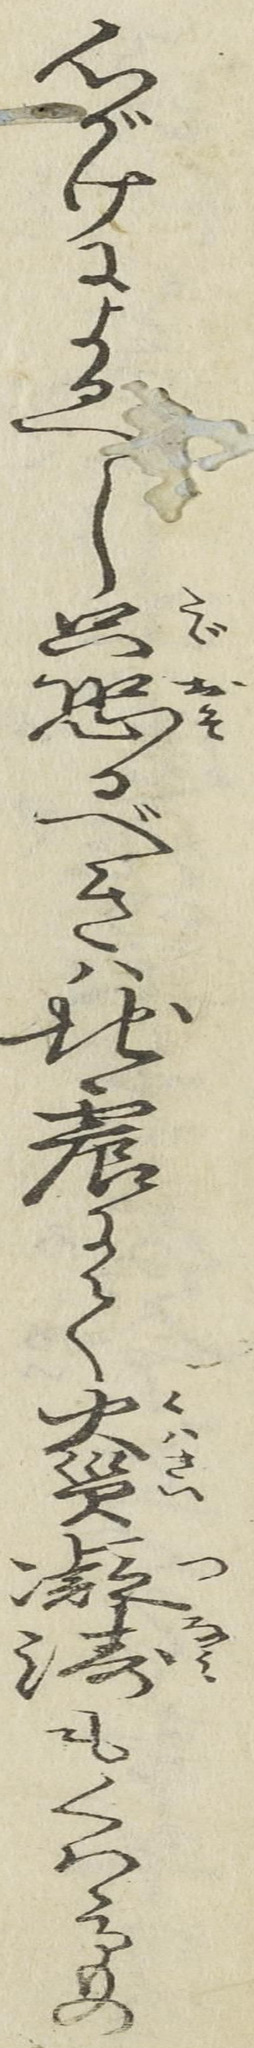心がけによるへし只恐るべきは地震にて火災凝濤もくはゝるもの
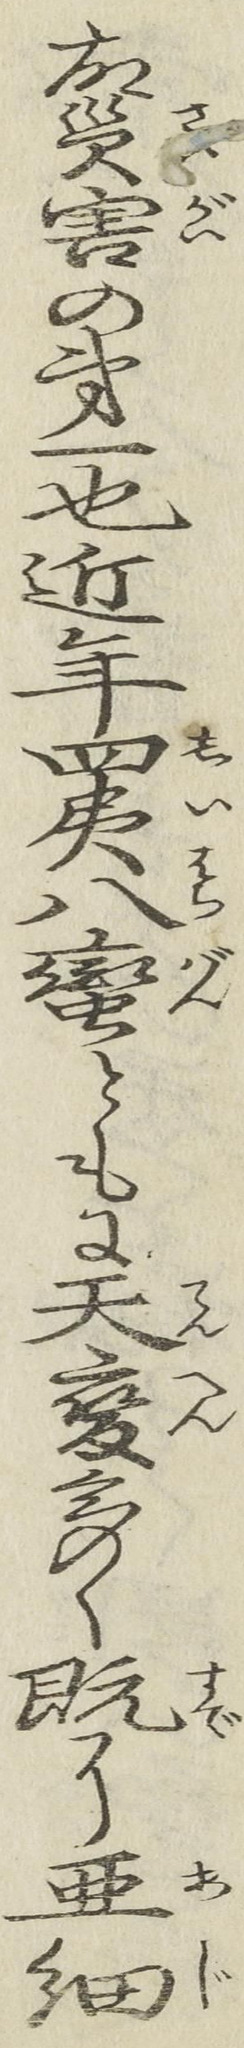故災害の第一也近年四夷八蛮ともに天変多く既に亜細
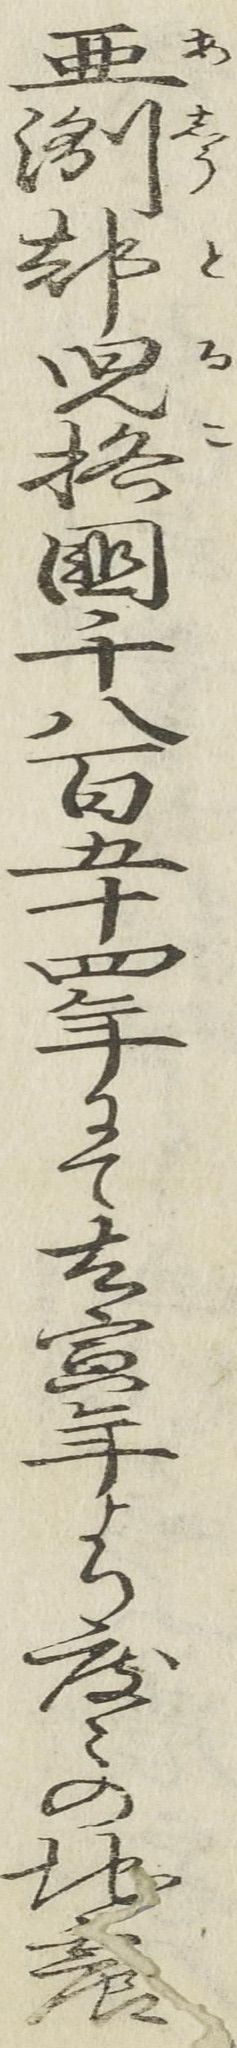亜洲都児格国千八百五十四年にて去寅年より度々の地震
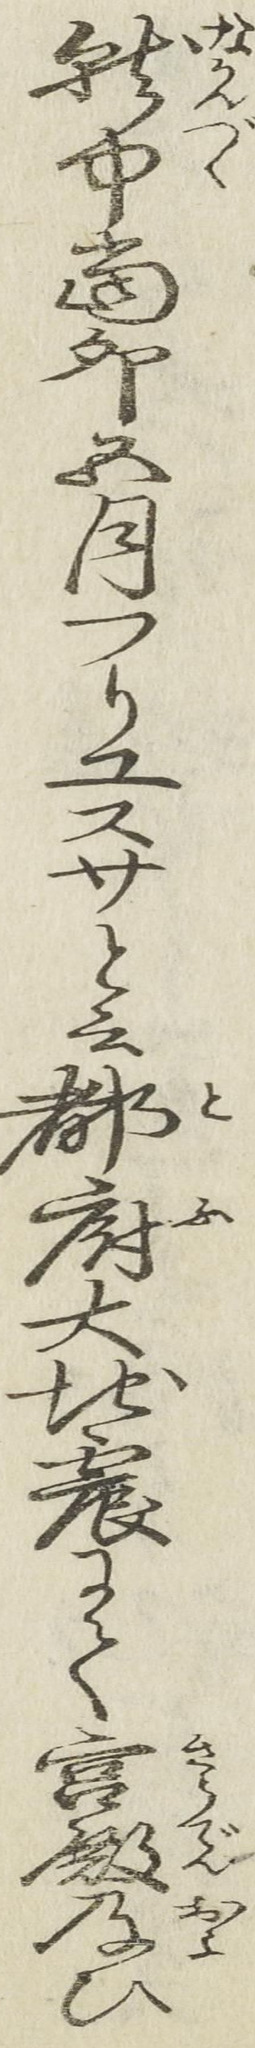就中当卯五月フリユスサと云都府大地震にて宮殿及ひ
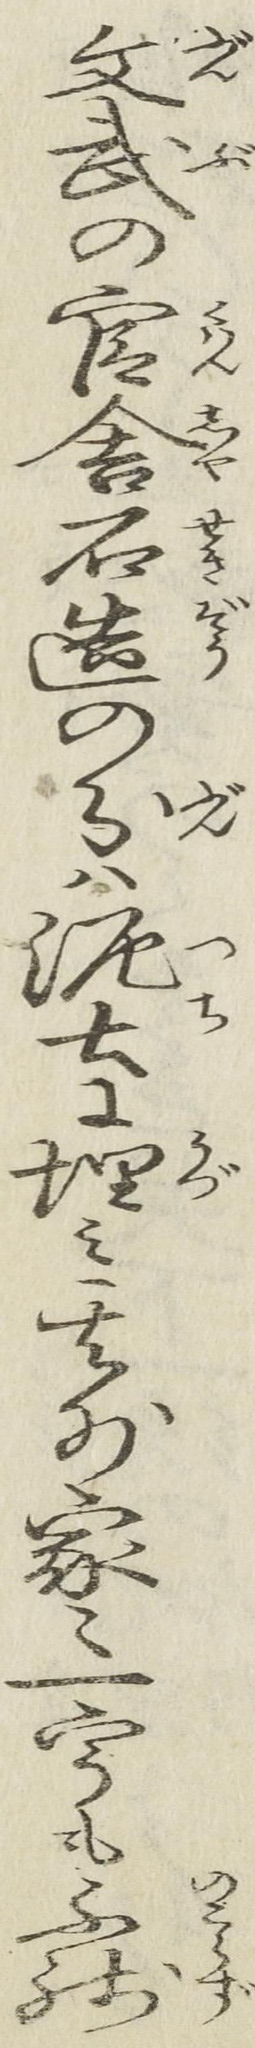文武の官舎石造の分は泥土に埋み其外家々一宇も不残
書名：震雷考説　全
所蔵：東京大学地震研究所図書室 Earthquake Research Institute Library, The University of Tokyo, JAPAN
